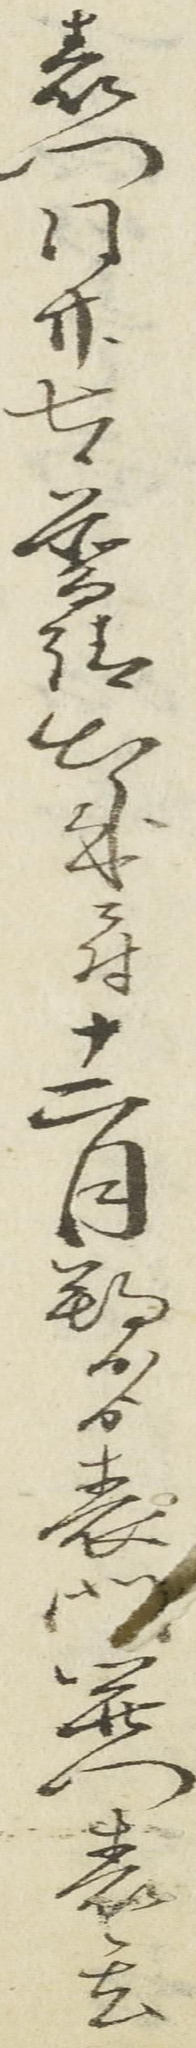表門同廿七日普請出来ニ付十二月朔日ゟ表門開門表玄
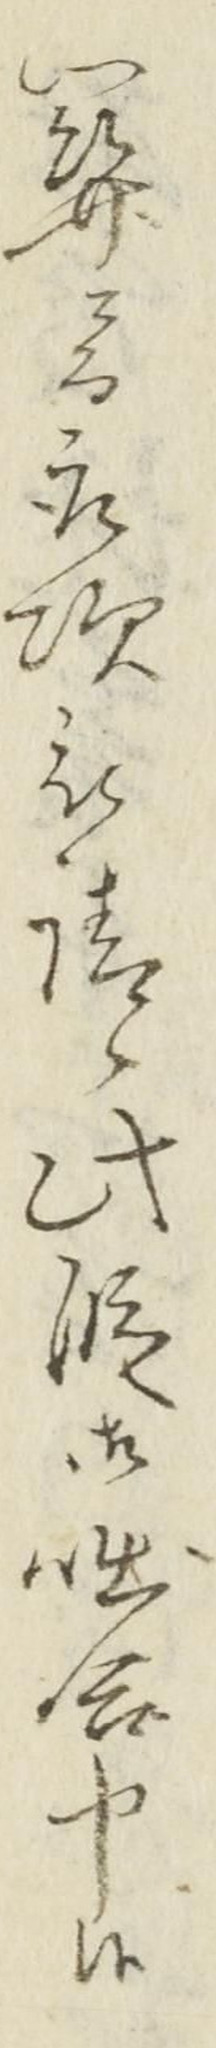関ニ而取次被請候此段御咄合申候
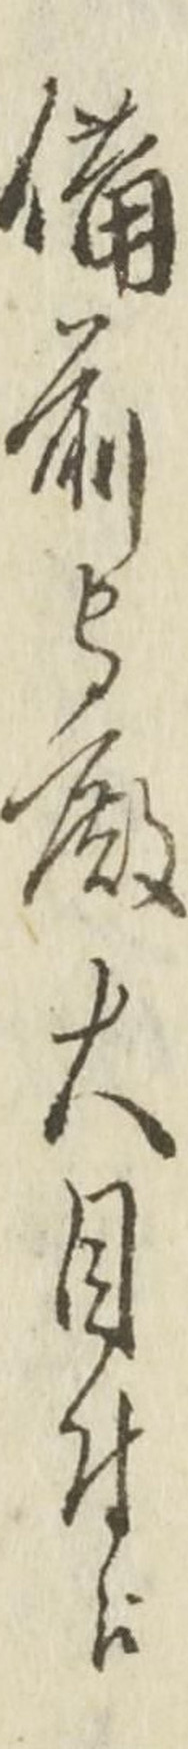備前守殿大目付え
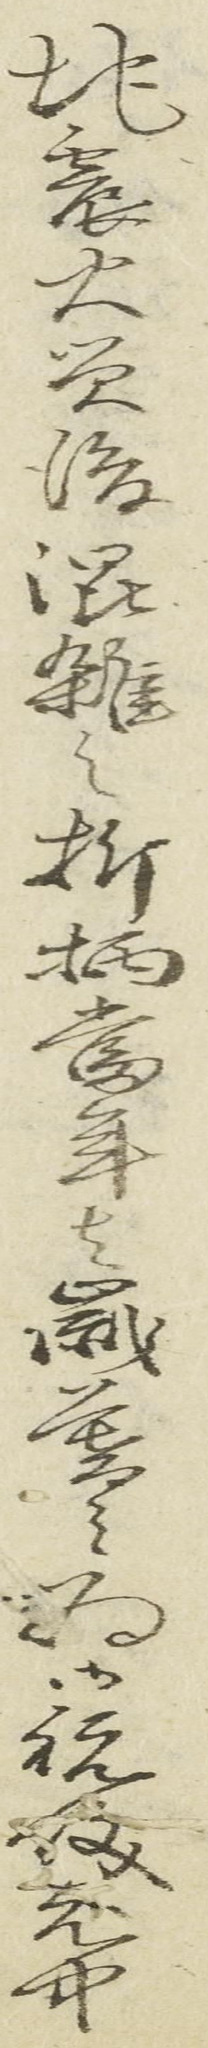地震火災後混雑之折柄当年は歳暮之為御祝義老中
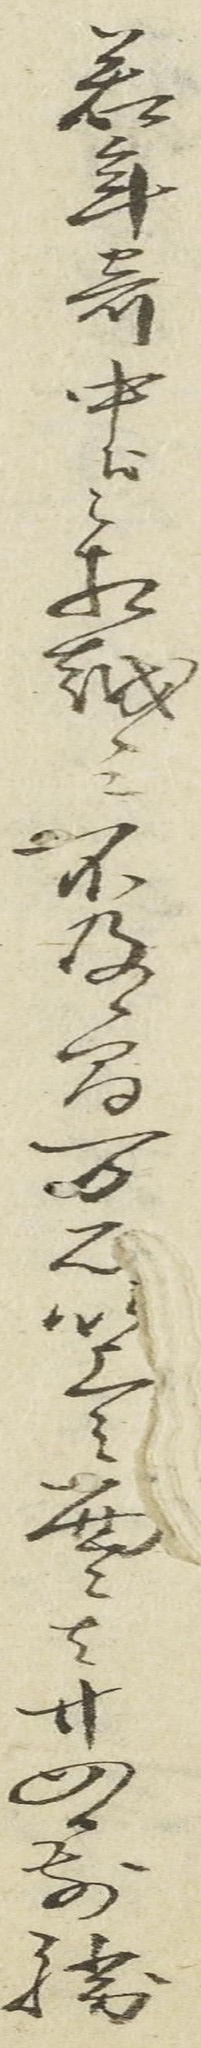若年寄中え被相越候ニ不及候間万石以上之面々は廿八日前勝
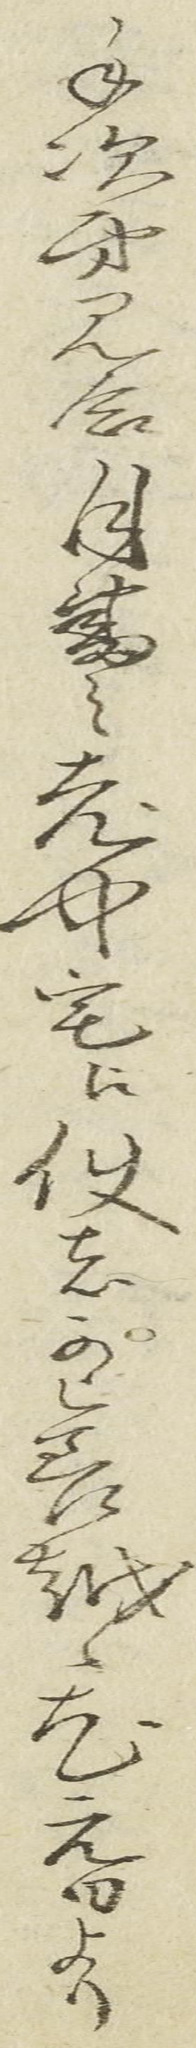手次第見合月番之老中宅え使者可被差越候尤元日より
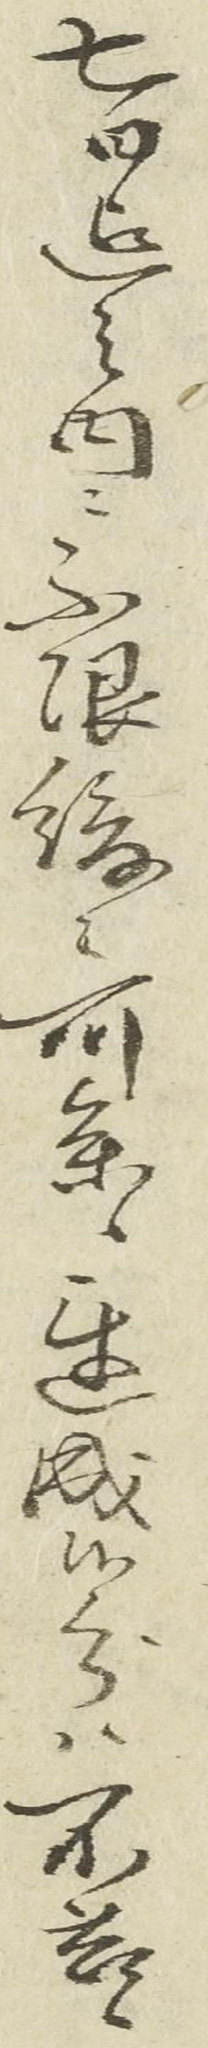七日迄之内ニ不限後々可参候遅成候分ハ不苦候
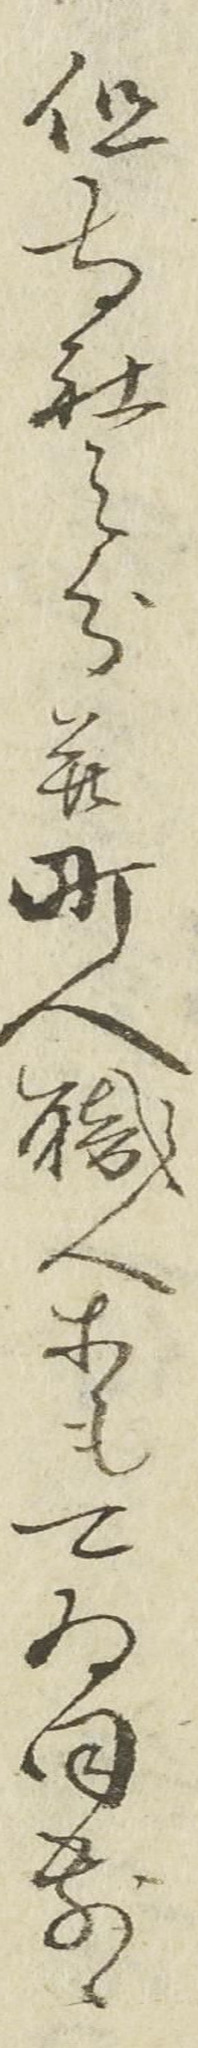但寺社之分并町人職人等も可為同前候
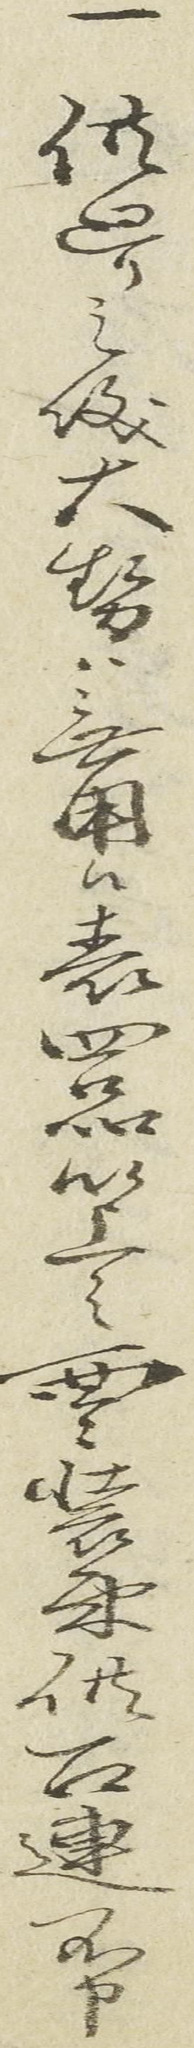一供廻り之儀大勢ハ無用候表四品以上之面々装束供召連不申
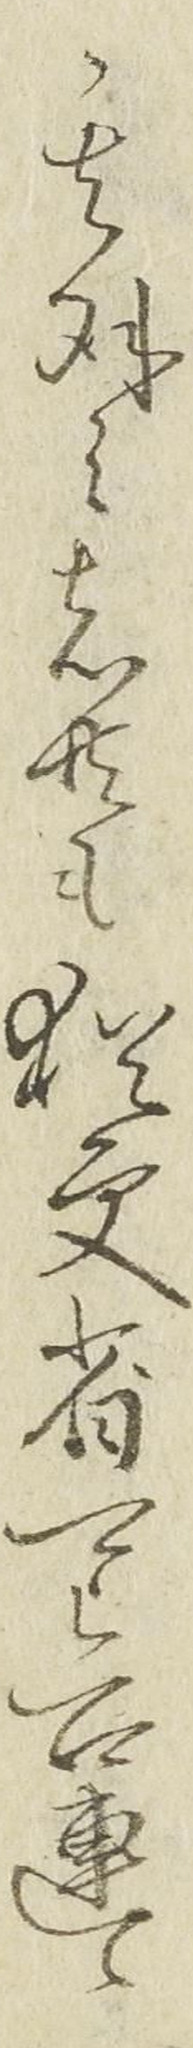其外之者共も猶更省可被召連候
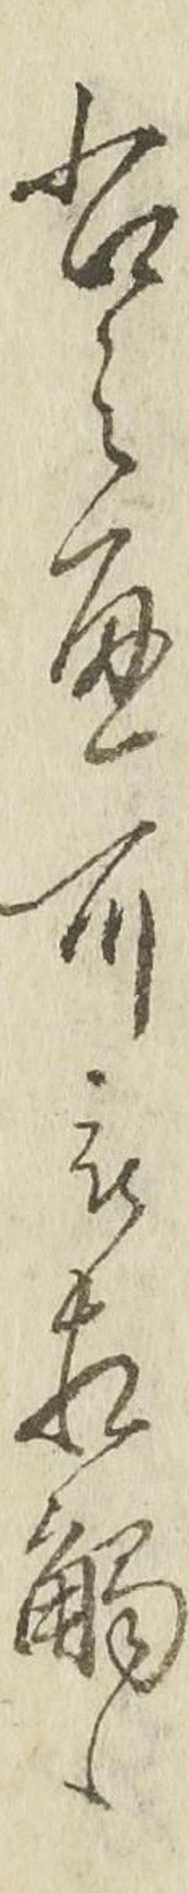右之通可被相触候
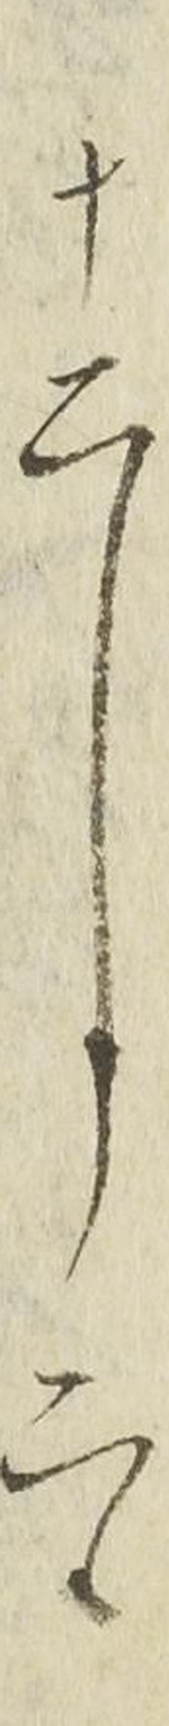十二月二日
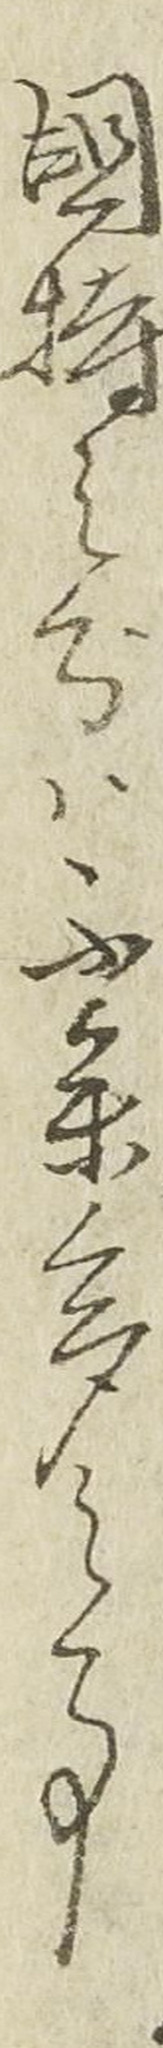国持之分ハ不参多候事
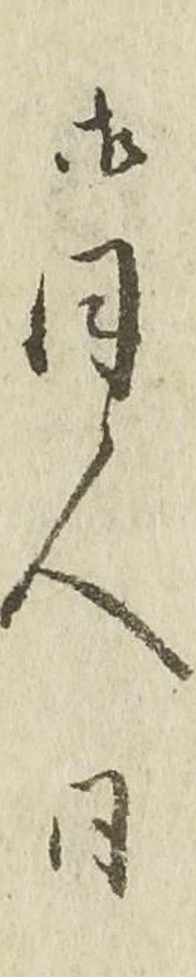御同人同

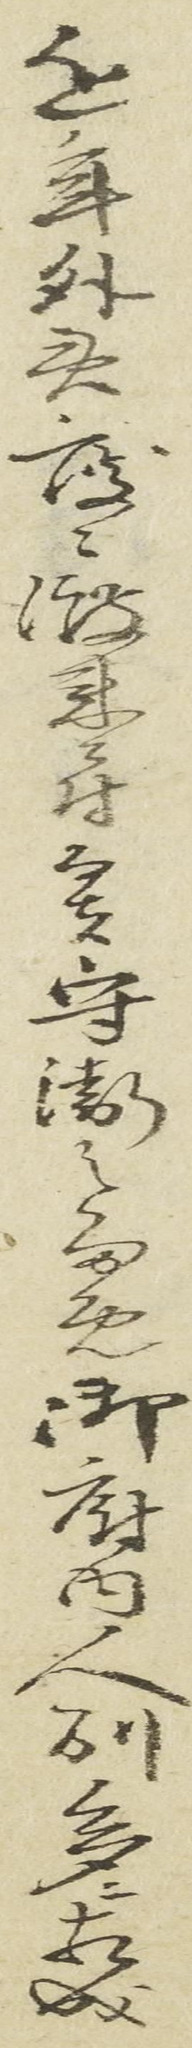近年外夷度々渡来ニ付而は守衛之ため五府内人別多ニ相成
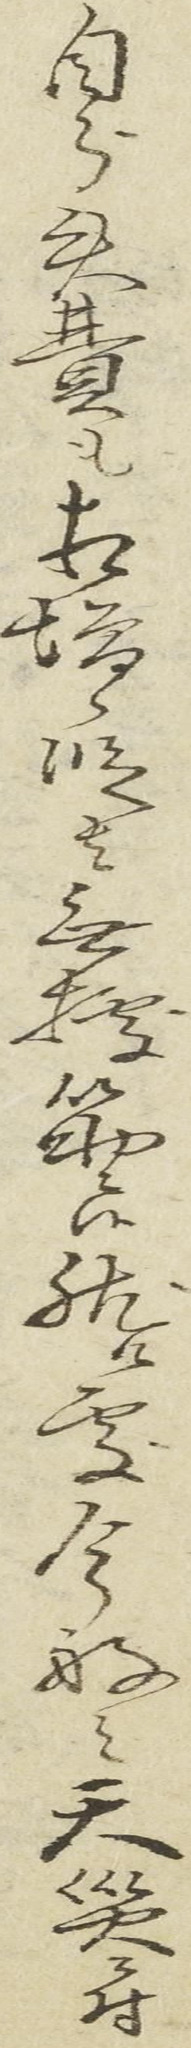自今失費も相増候段は無拠筋二候然ル処今般之天災二付
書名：安政二乙卯年十月二日大地震之事
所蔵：東京大学地震研究所図書室 Earthquake Research Institute Library, The University of Tokyo, JAPAN
